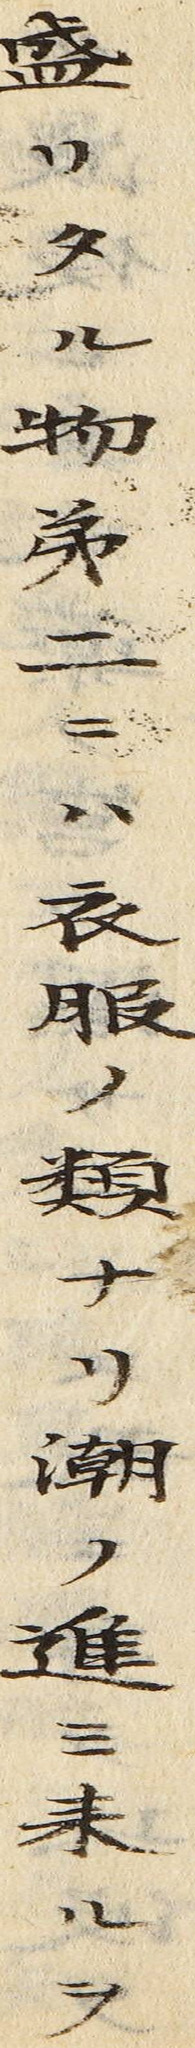盛リタル物第二ニハ衣服ノ類ナリ潮ノ進ミ来ルヲ
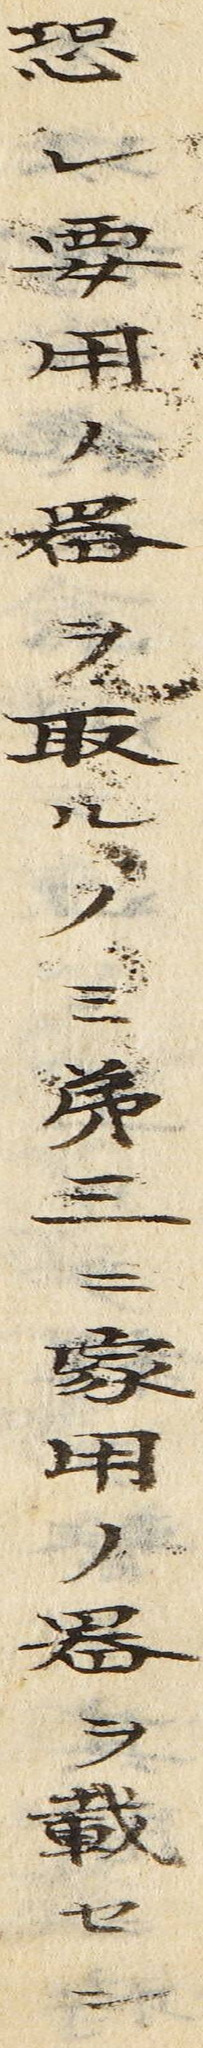恐レ要用ノ器ヲ取ルノミ第三ニ家用ノ器を載セン
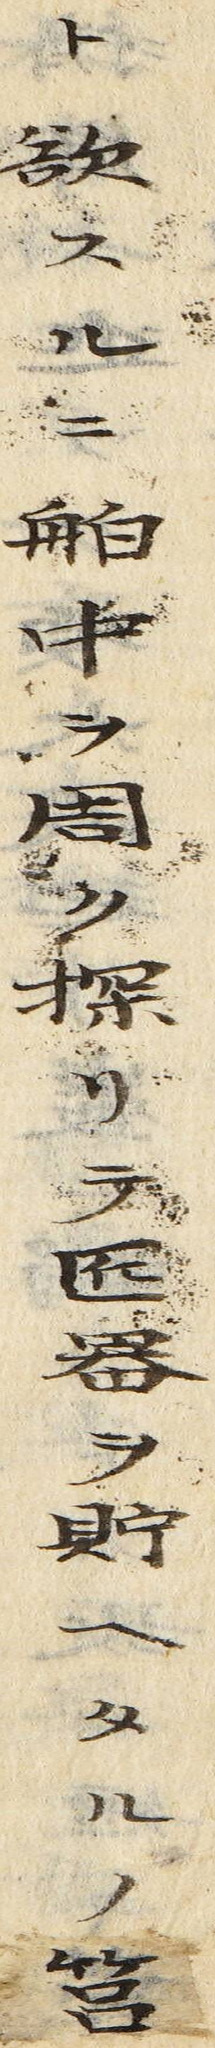ト欲スルニ舶中ヲ周ク探リテ匠器ヲ貯ヘタルノ筥
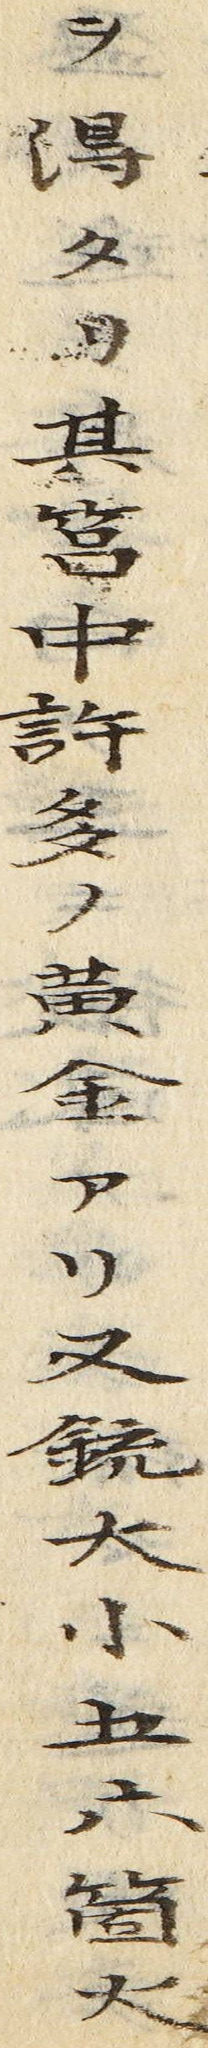ヲ得タリ其筥中許多ノ黄金アリ又銃大小五六箇火
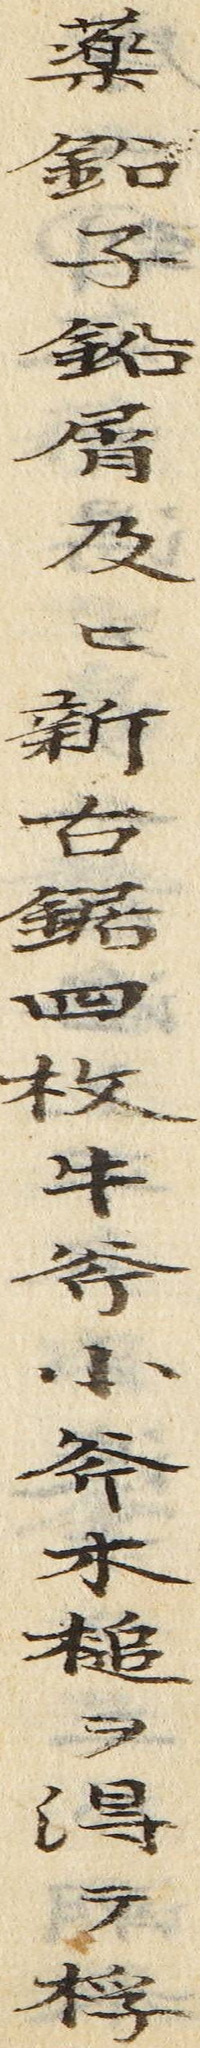薬鉛子鉛屑及ヒ新古鋸四枚牛斧小斧木槌ヲ得テ桴
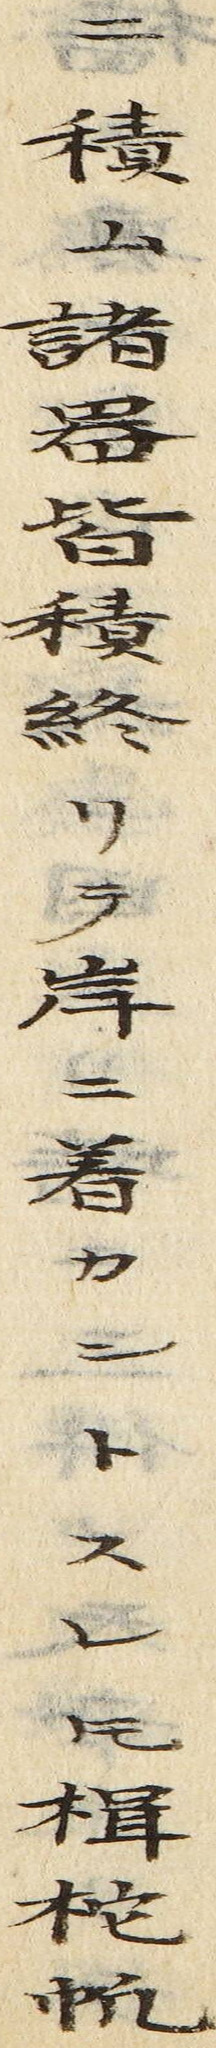ニ積ム諸器皆積終リテ岸ニ着カントスレトモ楫柁帆

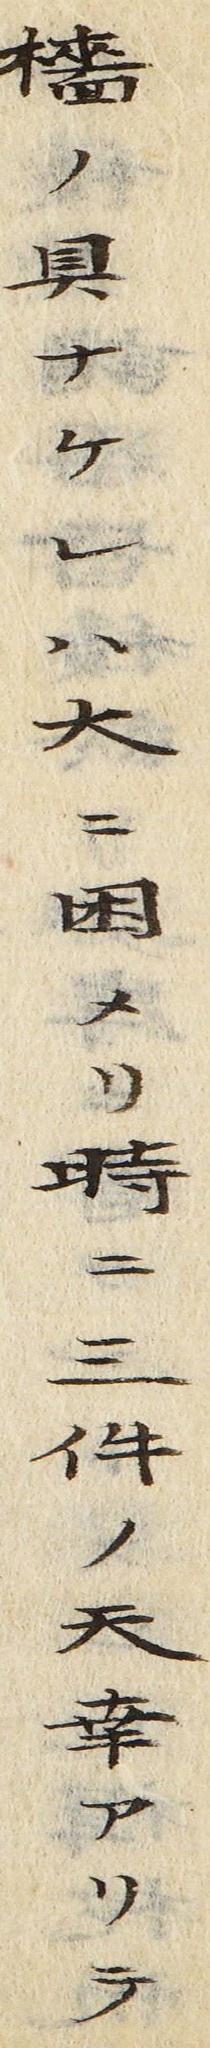檣ノ具ナケレハ大ニ困メリ時ニ三件ノ天幸アリテ
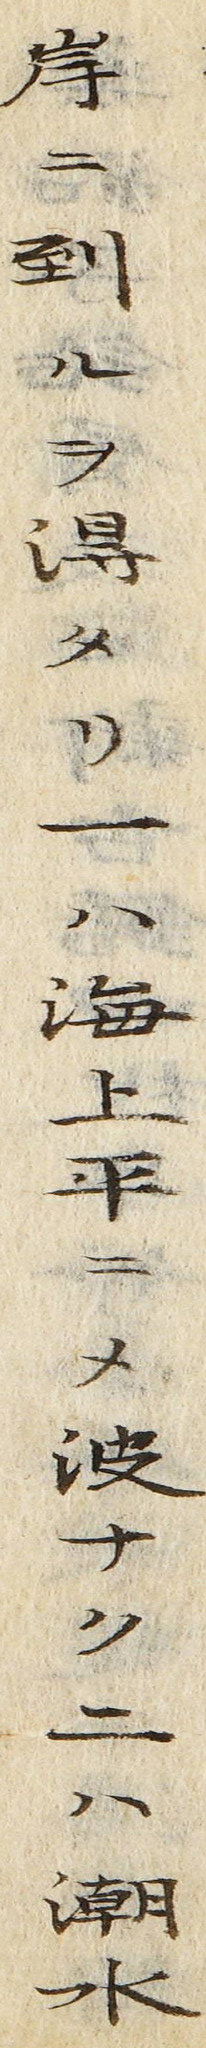岸ニ到ルヲ得タリ一ハ海上平ニシテ波ナク二ハ潮水
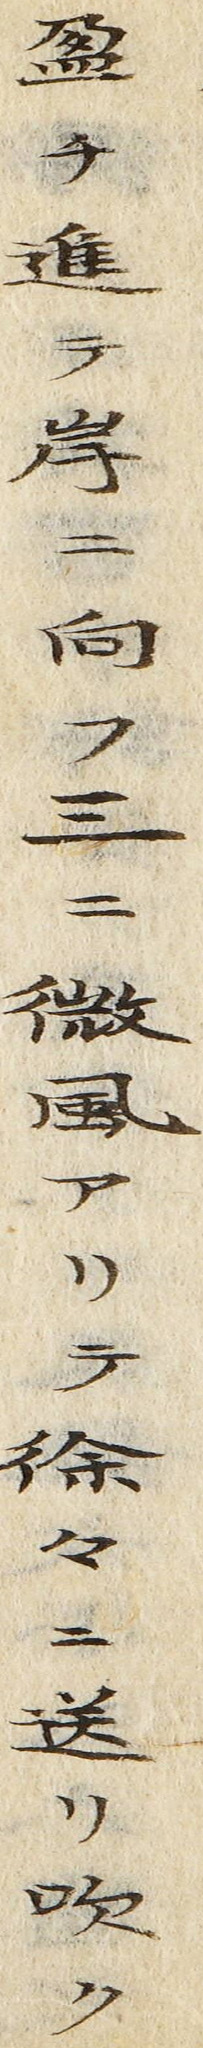盈チ進テ岸ニ向フ三ニ微風アリテ徐々ニ送リ吹ク
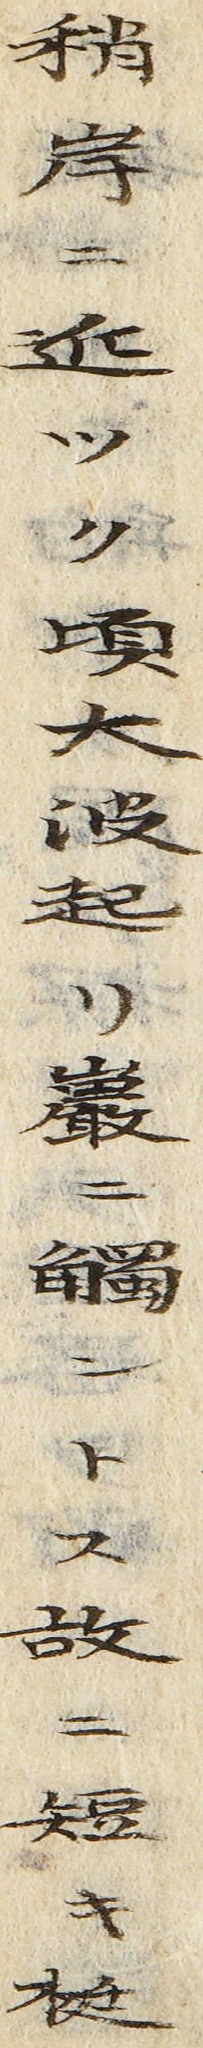稍岸ニ近ツク頃大波起リ巌ニ触ントス故ニ短キ梃
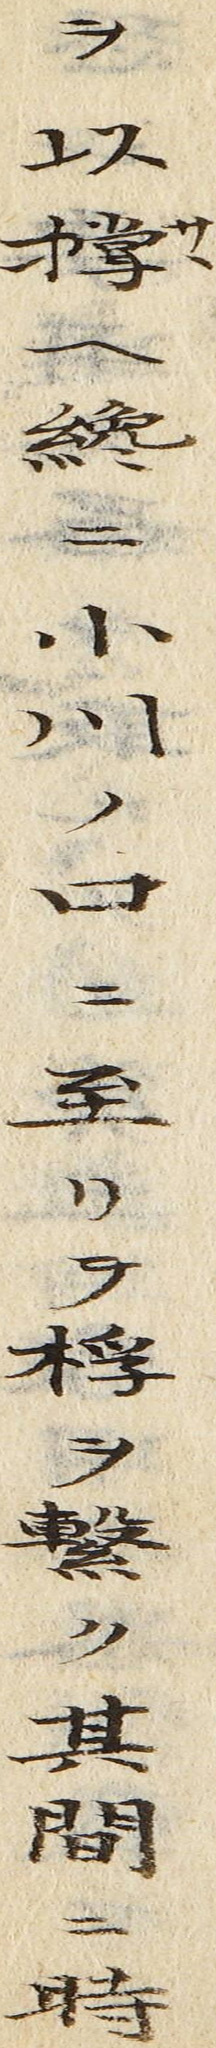ヲ以撑ヘ纔ニ小川ノ口ニ至リテ桴ヲ繋ク其間ニ時
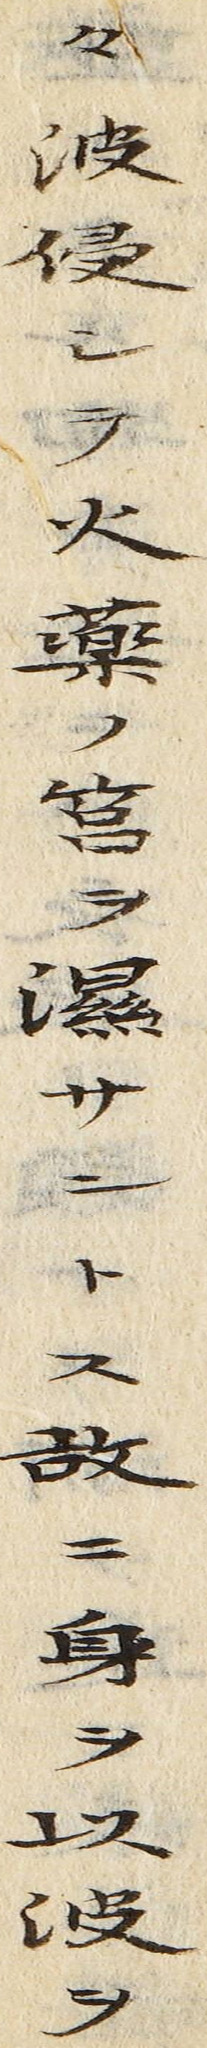々波侵シテ火薬ノ筥ヲ湿サントス故ニ身ヲ以波ヲ
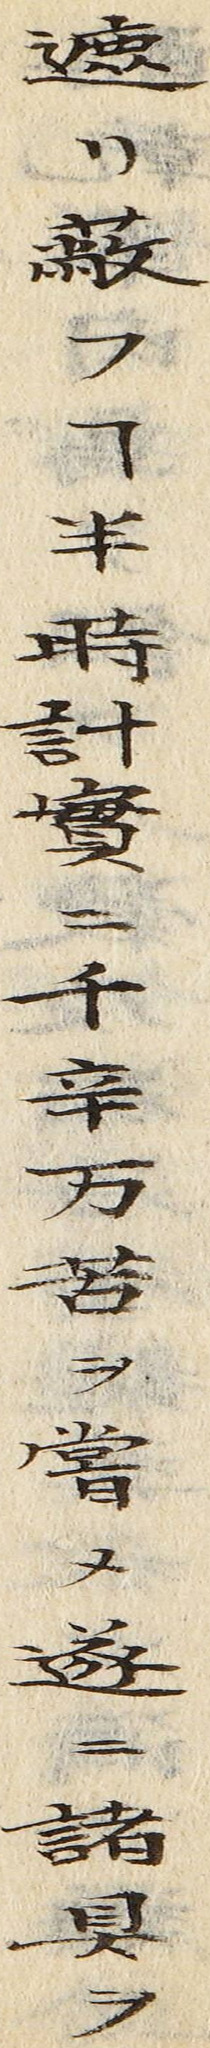遮リ蔽フコト半時計実ニ千辛万苦ヲ嘗メ遂ニ諸具ヲ
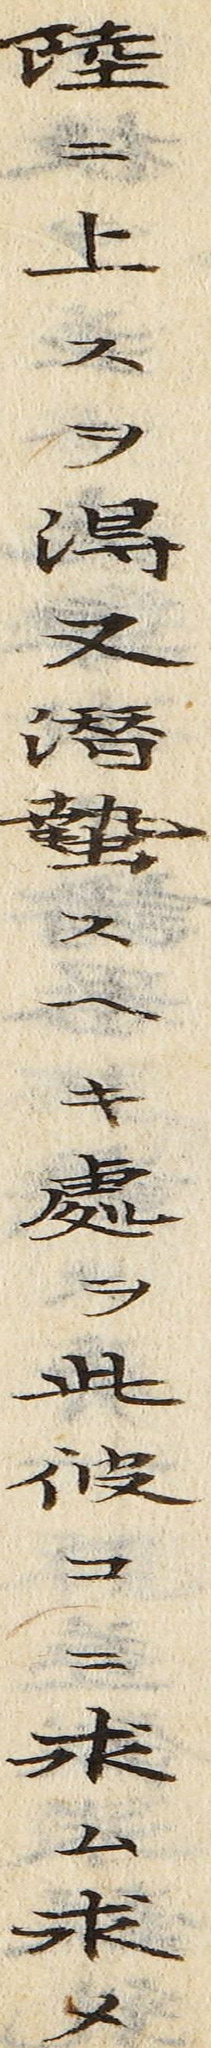陸ニ上スヲ得又潜蟄スヘキ処ヲ此彼コニ求ム求メ
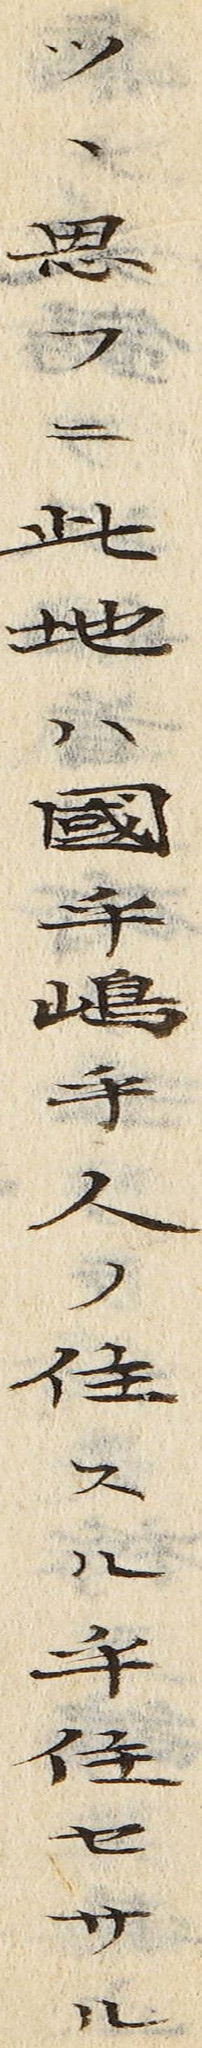ツヽ思フニ此地ハ国乎島乎人ノ住スル乎住セサル
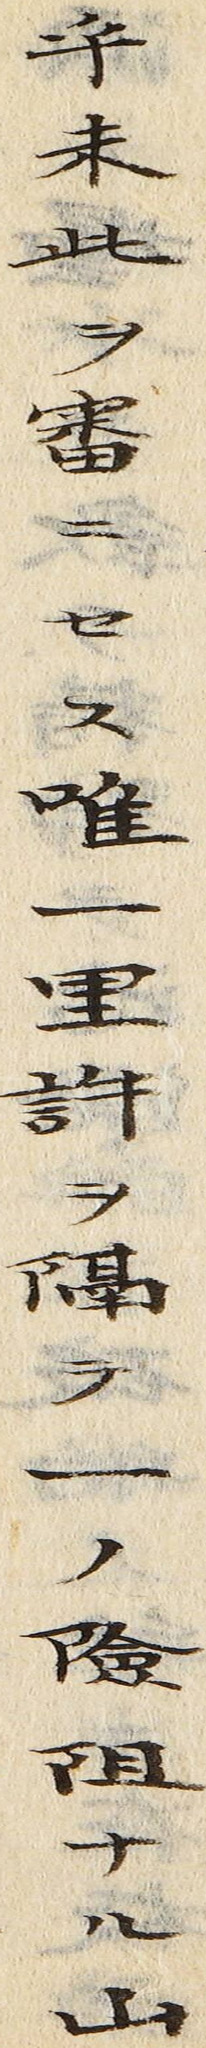乎未此ヲ審ニセス唯一里許ヲ隔テ一ノ険阻ナル山
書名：漂流紀事
